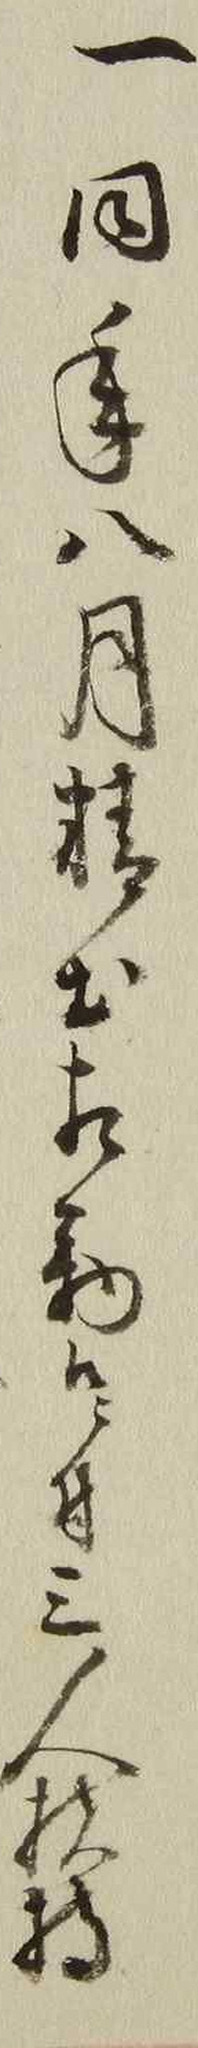一同年八月精出相勤候ニ付三人扶持
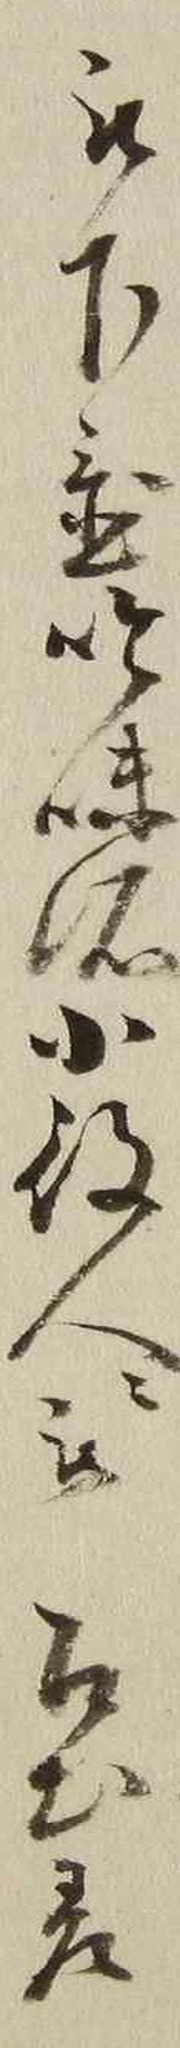被下置吟味所小後人ニ被召出差
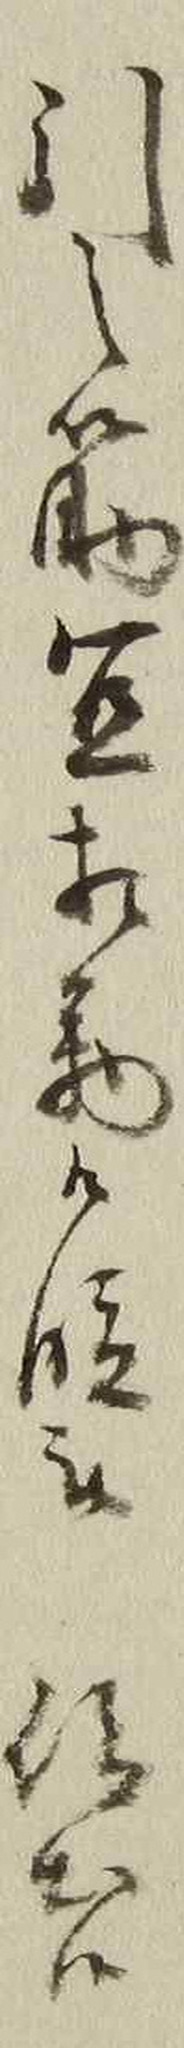引之筋宜相勤候段被仰出候
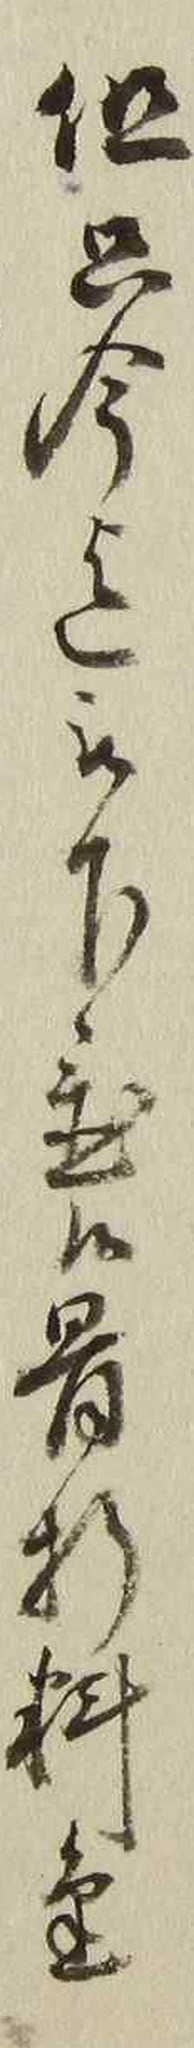但只今迄被下置候骨折料金
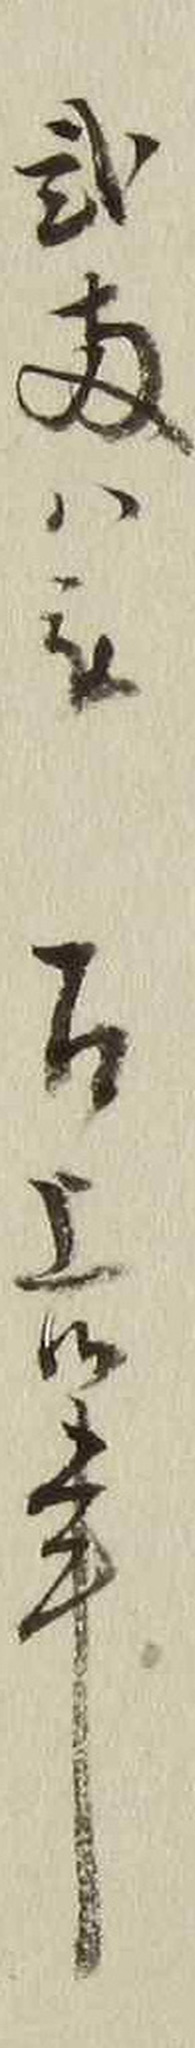弐両ハ被召上候事
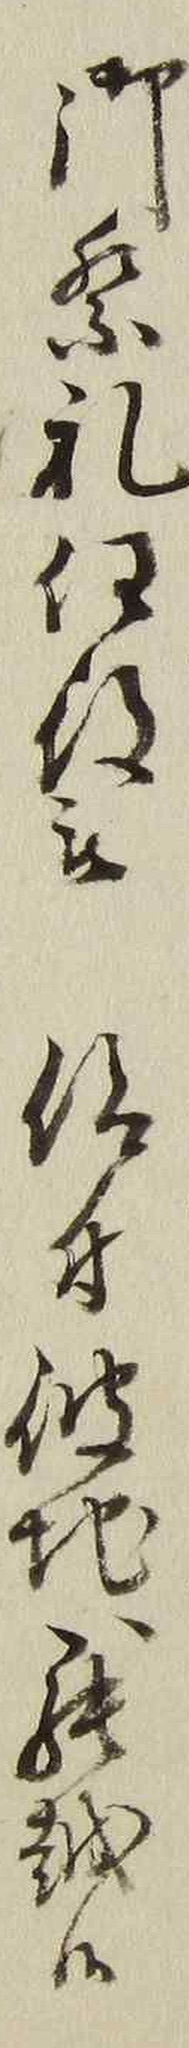御祭礼任役被仰付彼地へ罷越候
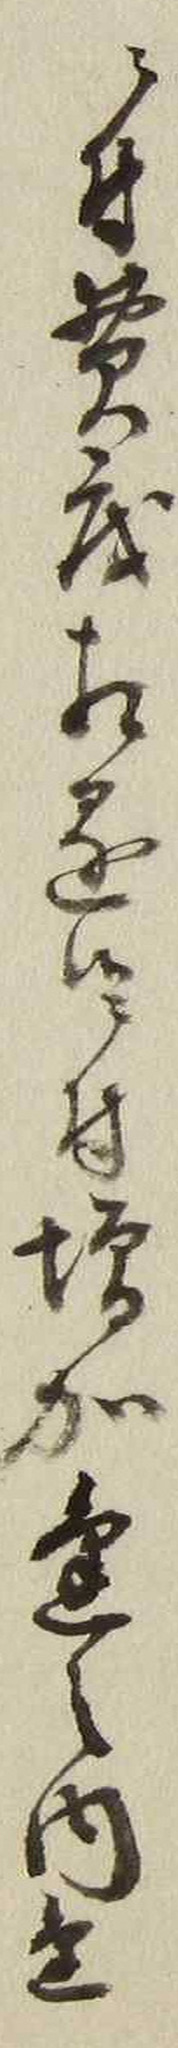ニ付費茂相懸候ニ付増加金之内金
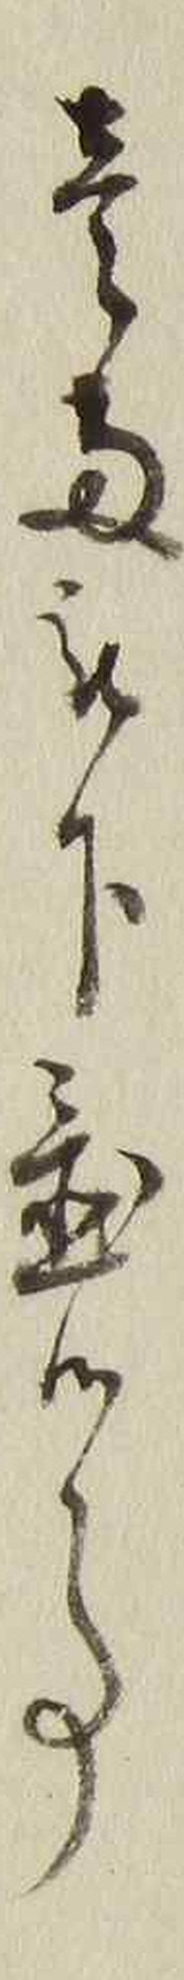壱両被下置候事
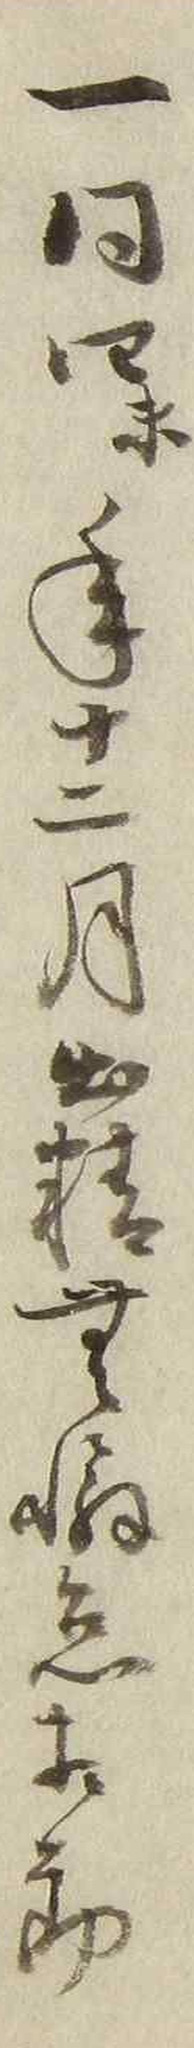一同四未年十二月出精無懈怠相勤

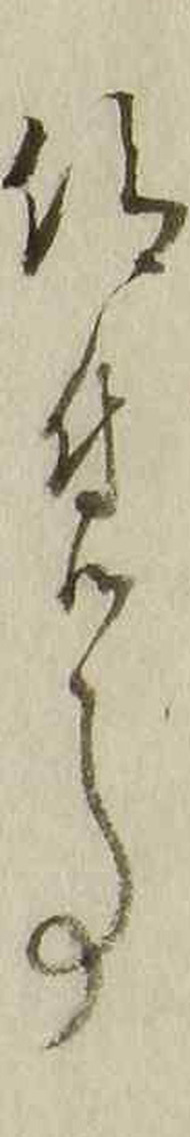仰付候事
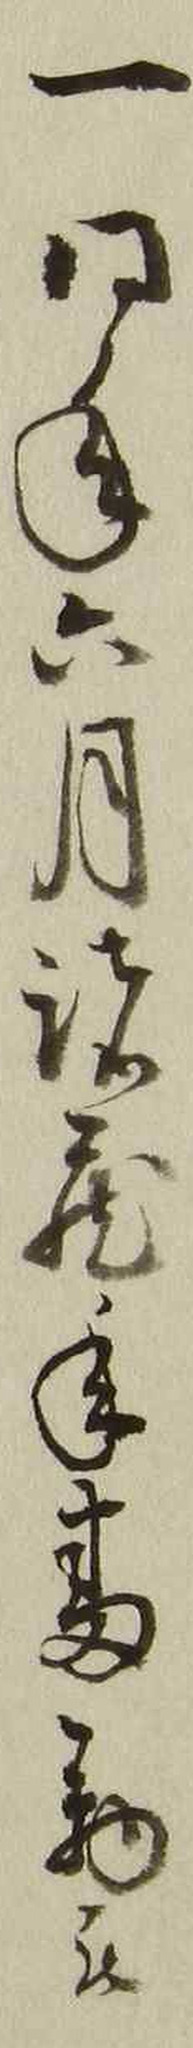一同年六月諸蔵年番勤被
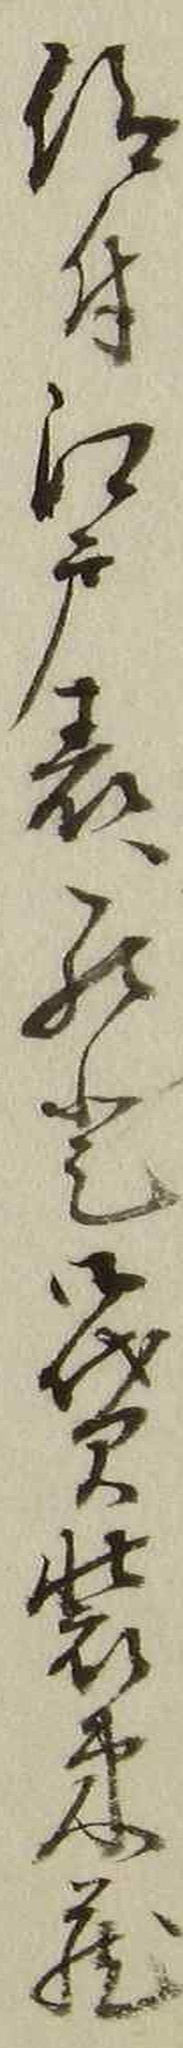仰付江戸表へ罷登御貸装束蔵
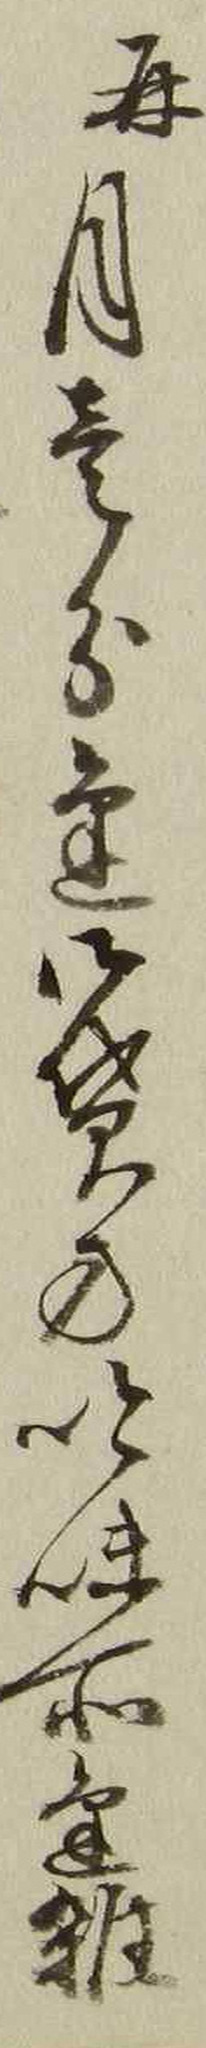并月壱分金御貸方吟味所金
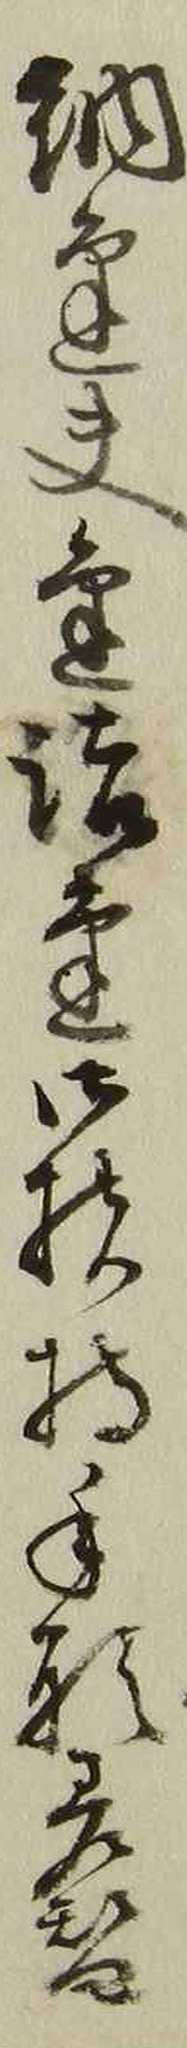納金夫金諸金御扶持手形差替
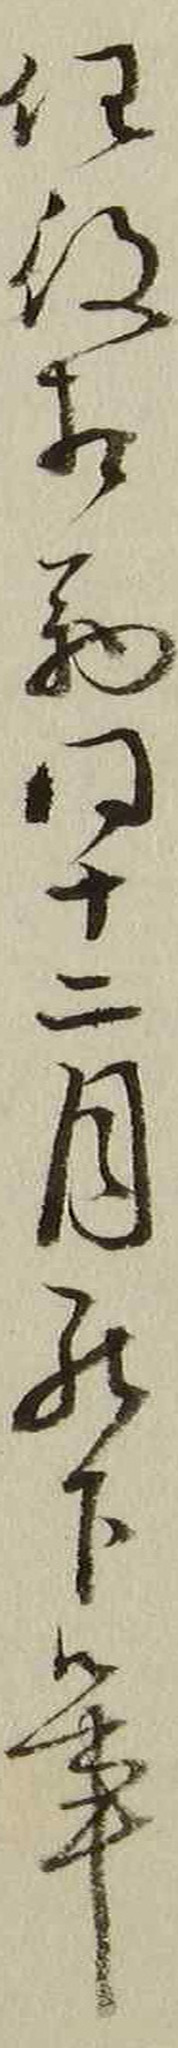任役相勤同十二月罷下候事
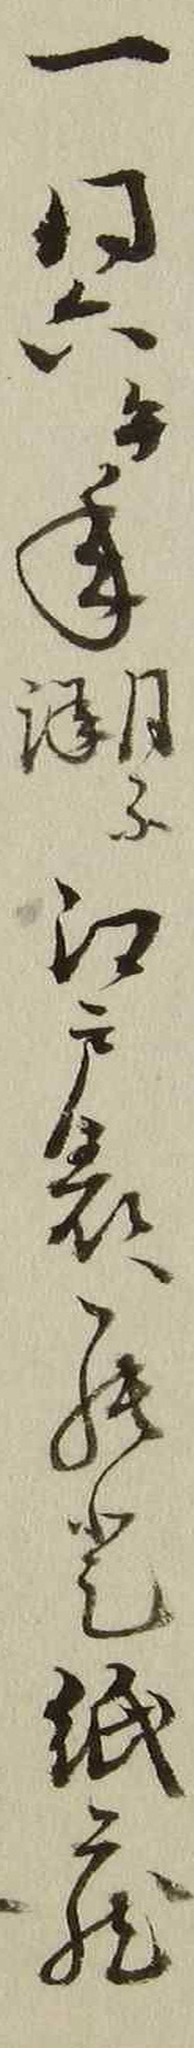一同六午月不詳江戸表へ罷登紙蔵
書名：諸士系譜　巻之39　は之部7
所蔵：会津若松市立会津図書館
